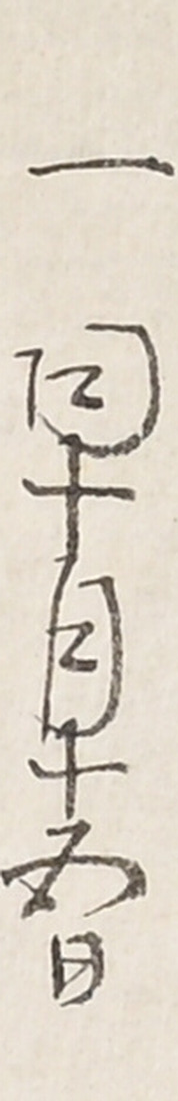一同十月十五日
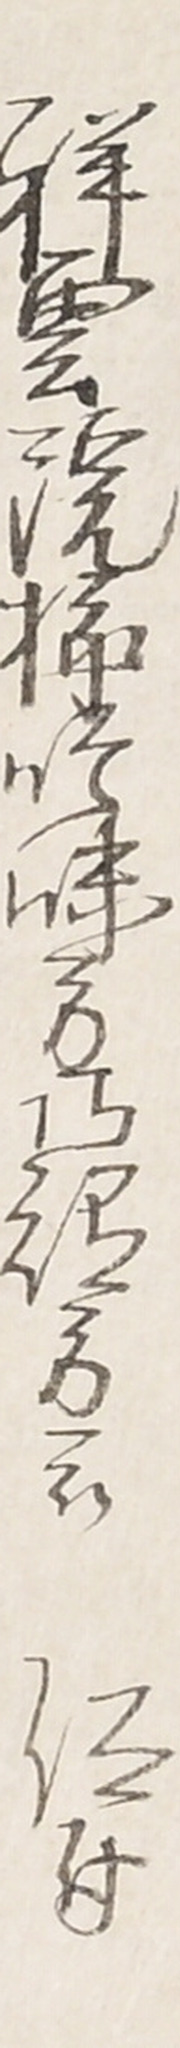祥雲院様吟味方御賄方被仰付
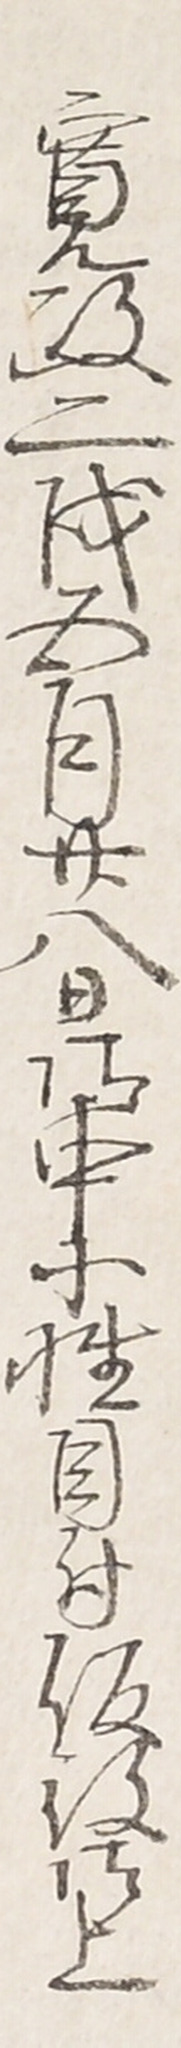一寛政二戌五月二十八日御中小性目付仮役御上
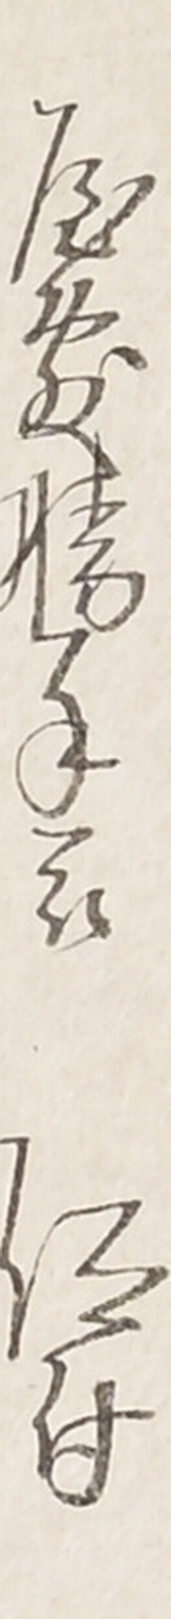屋敷勝手被仰付
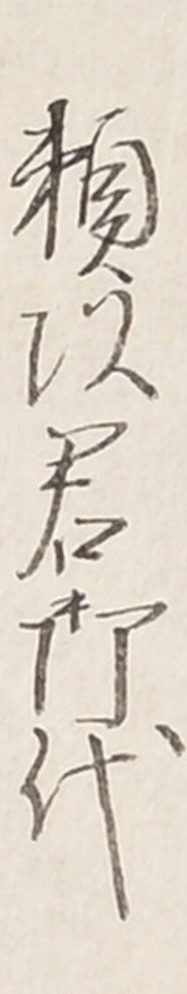頼以君御代
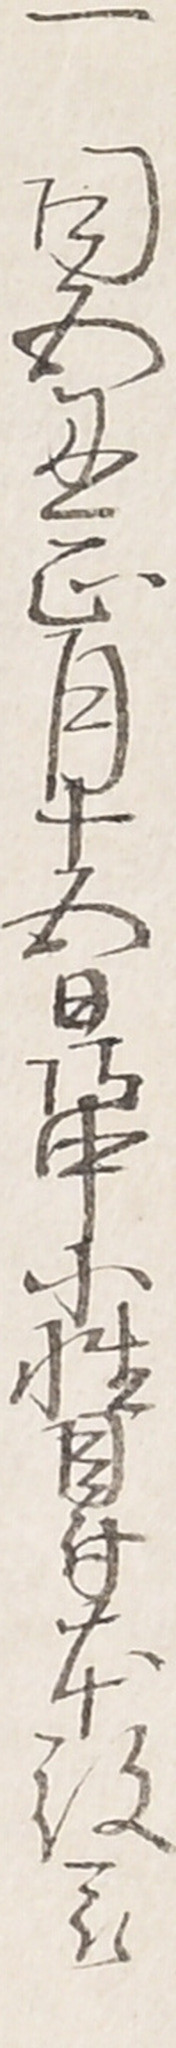一同五丑正月十五日御中小性目付本役被
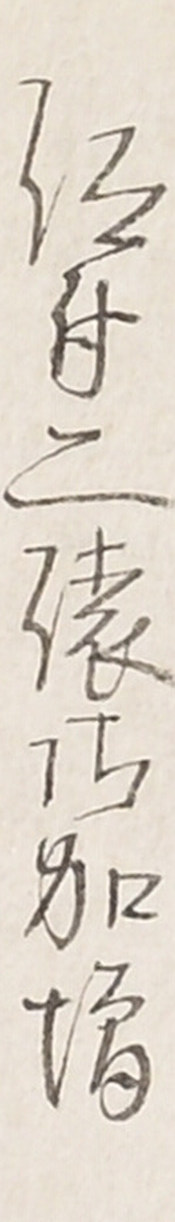仰付ニ俵御加増
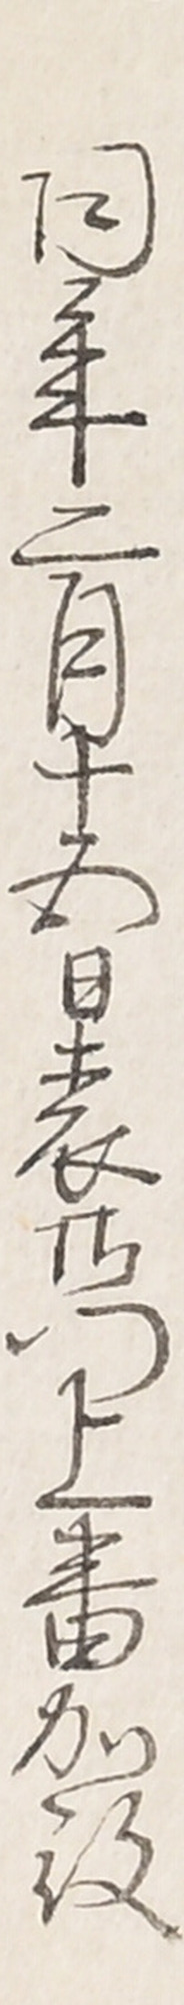一同年二月十五日表御門上番加役
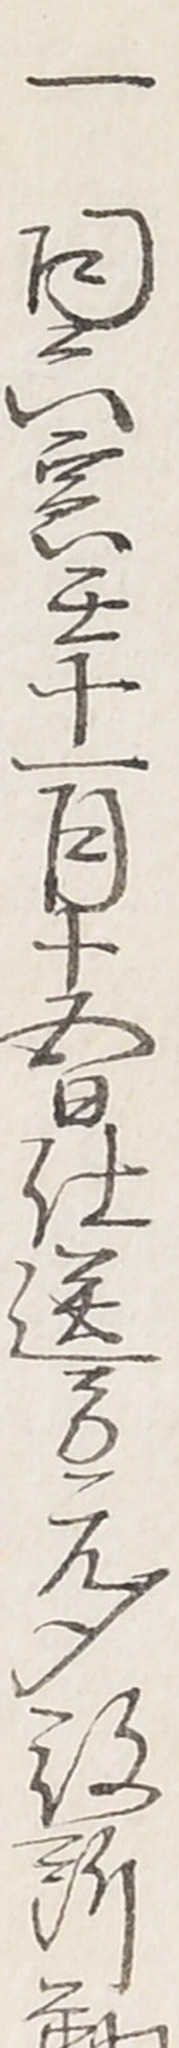一同六寅閏十一月十五日仕送方元〆役所勤
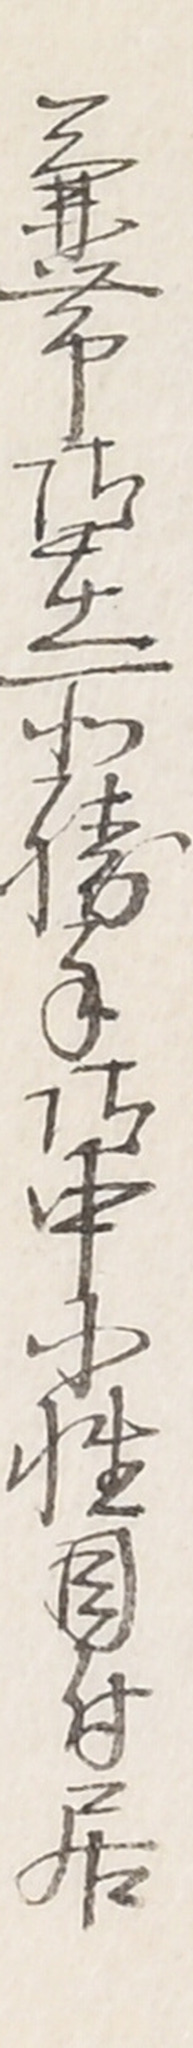兼帯御在所勝手御中小性目付居
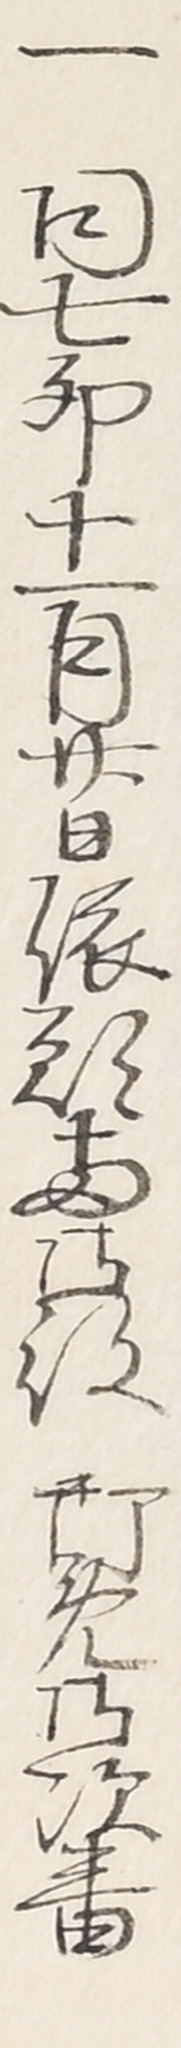一同七卯十一月廿日依願両御役御免御次番
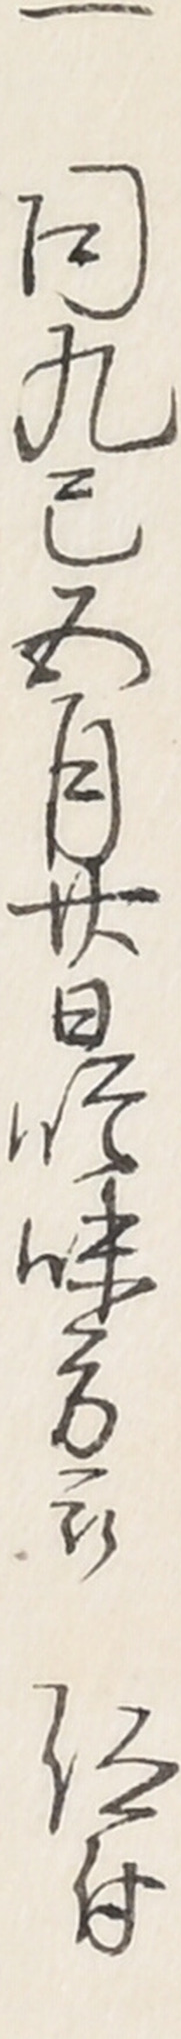一同九巳五月廿日吟味方被仰付
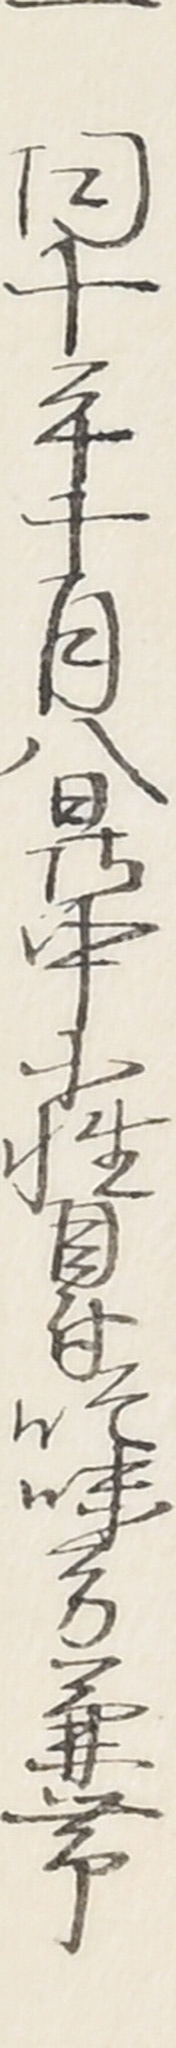一同十午十月八日御中小性目付吟味方兼帯
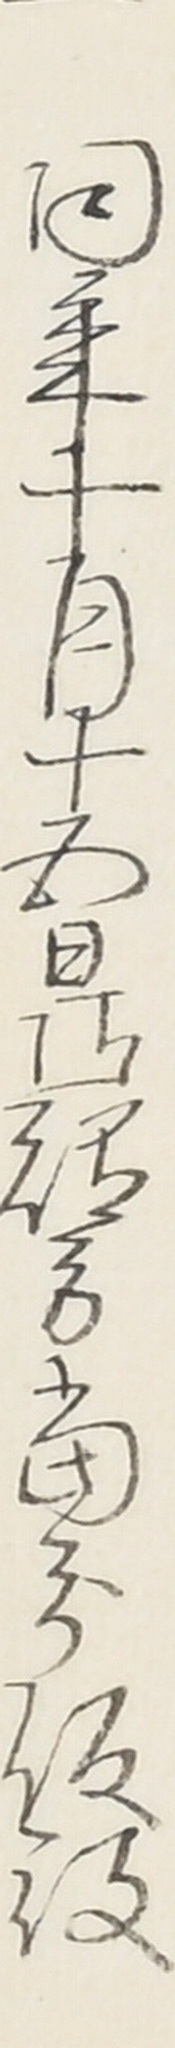一同年十月十五日御賄方当分仮役
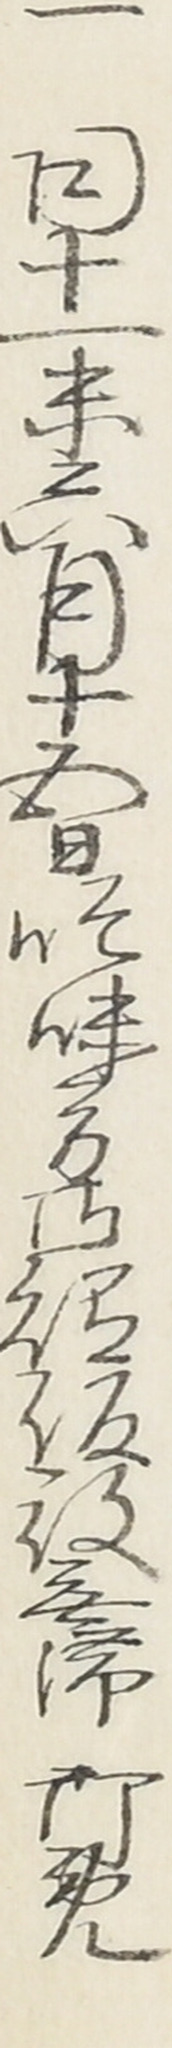一同十一未六月十五日吟味方御賄仮役無滞御免
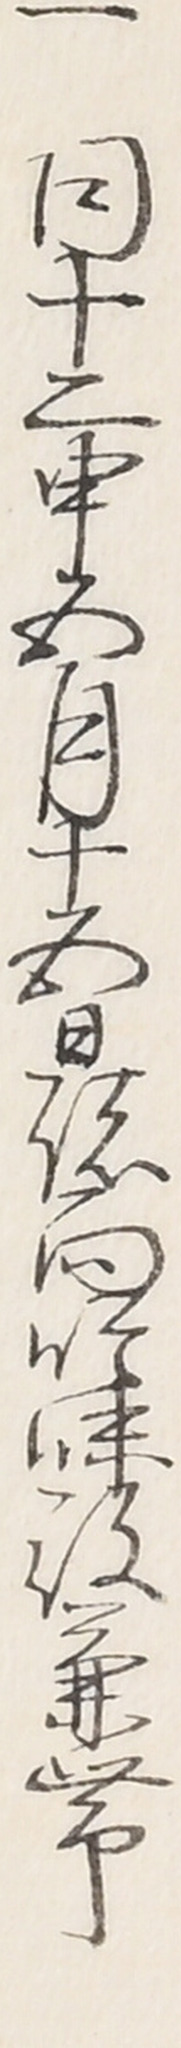一同十二申五月十五日諸向吟味役兼帯
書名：無足諸士勤仕録（四）
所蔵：伊那市立高遠町図書館・合同会社AMANE
